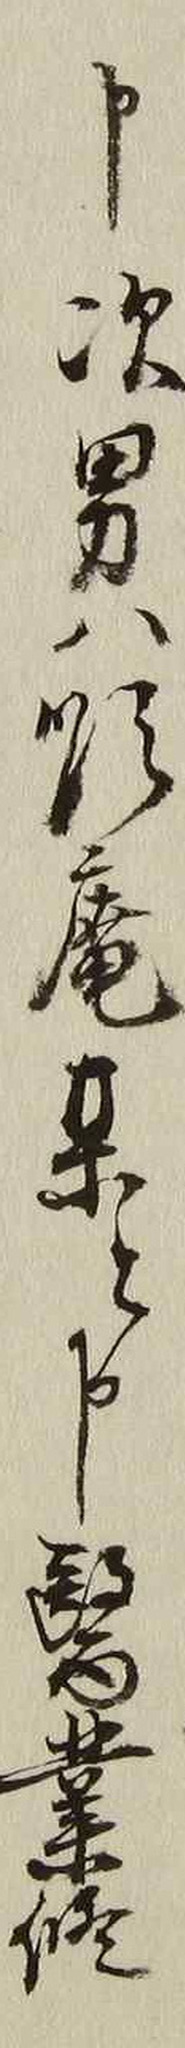申次男ハ順庵某と申医業修
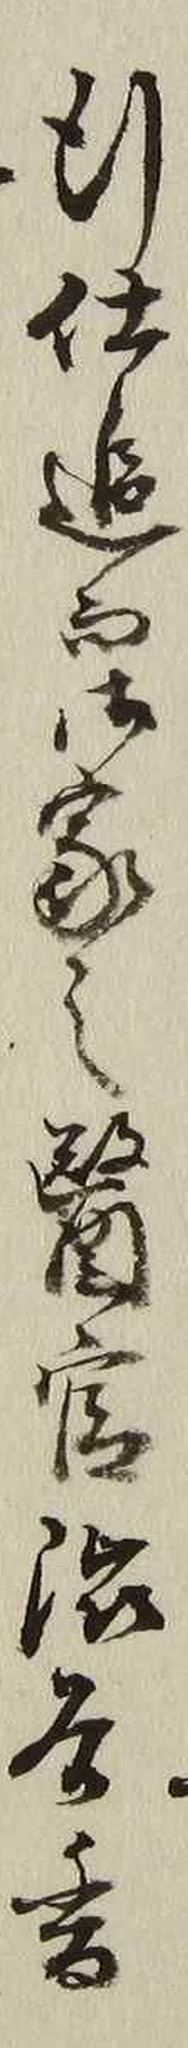行仕追而御家之医官渋谷香
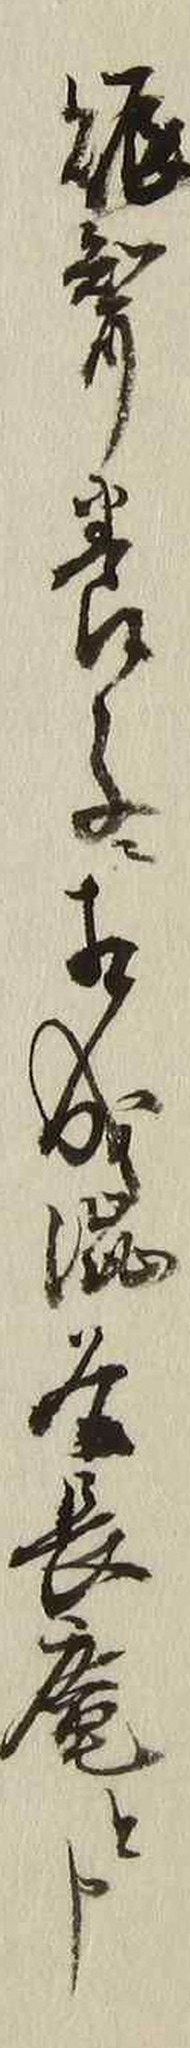賑婿養子ニ相成渋谷長庵と申
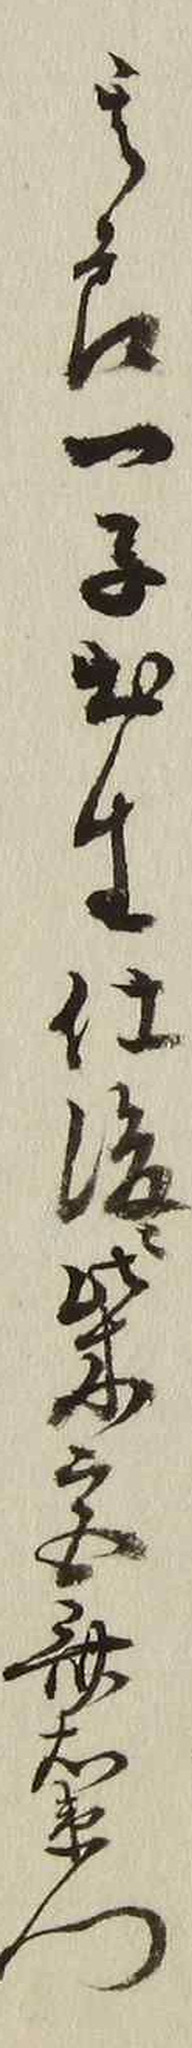其節一子出生仕後ニ柴宮斎右衛門
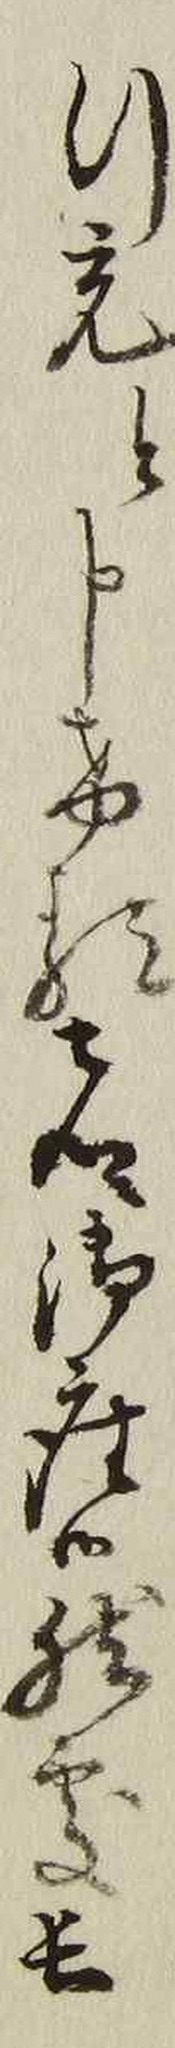行充と申ける者御座候然処長
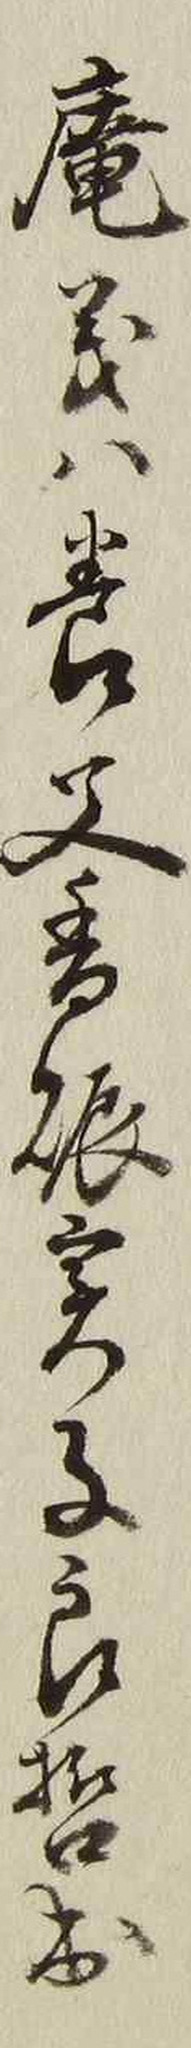庵義ハ養父香賑実子郎哲出
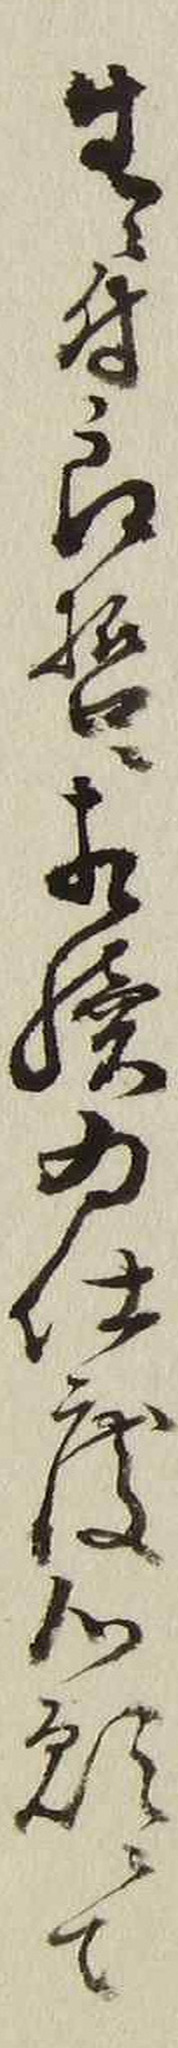生ニ付郎哲ニ相続為仕度心願ニて
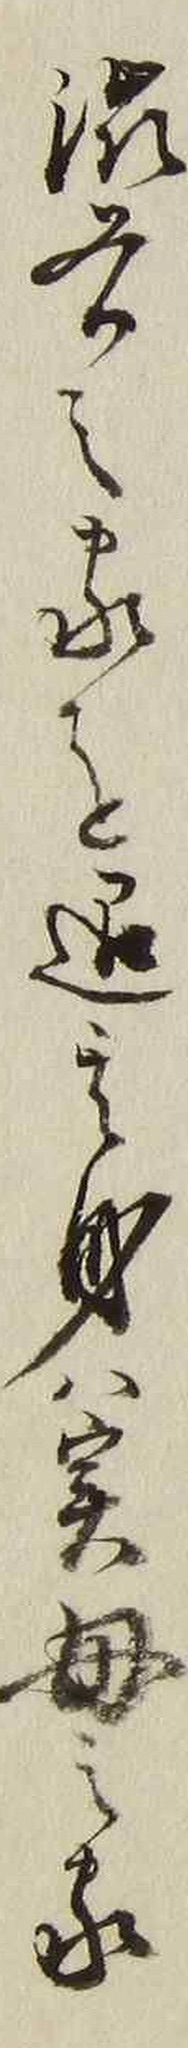渋谷之家を退其身実ハ母之家
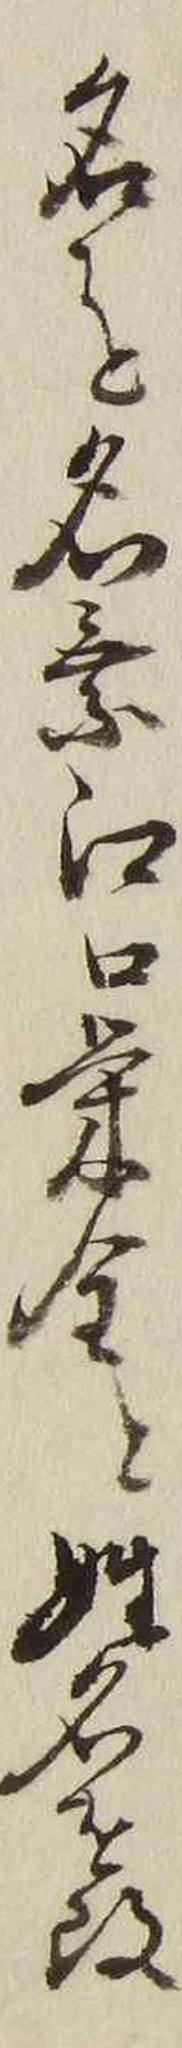名を名乗江口栄全と姓名を改

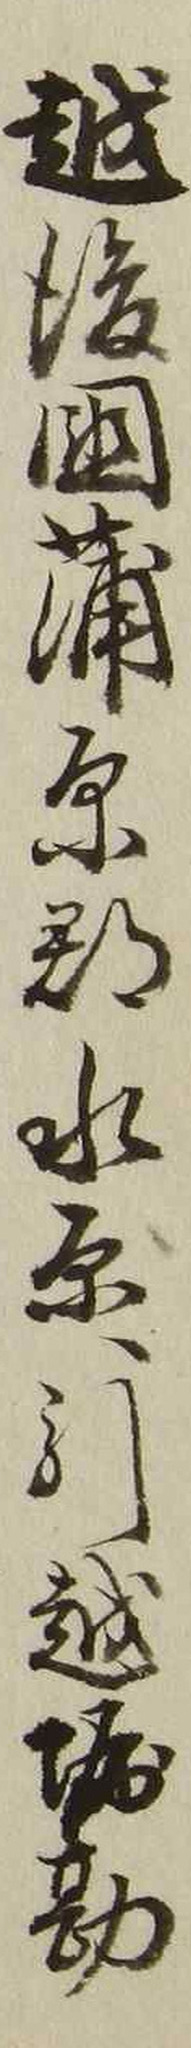越後国蒲原郡水原へ引越堀勘
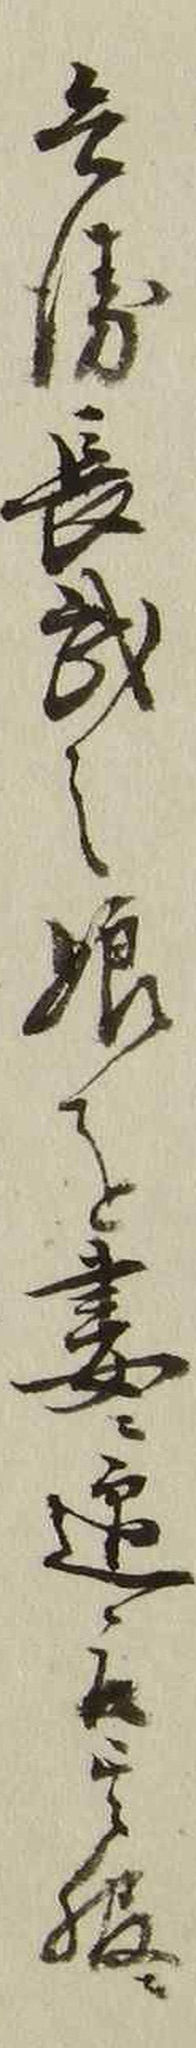兵衛長武之娘を妻ニ迎取其腹ニ
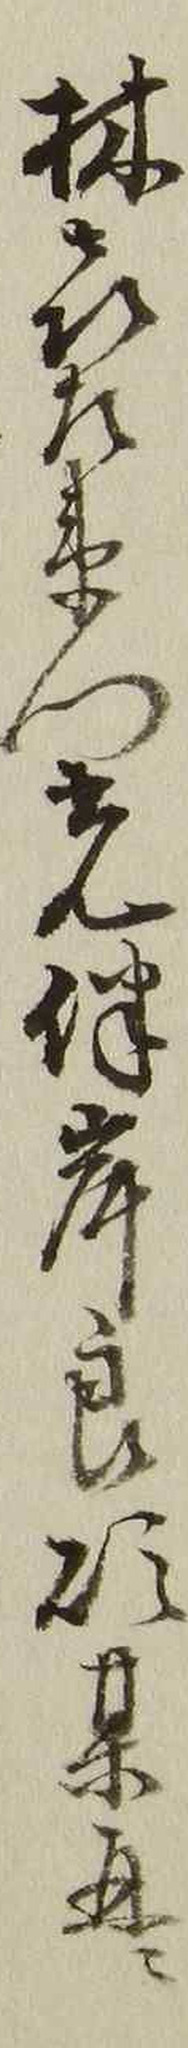林喜左衛門光伴岸良次某并ニ
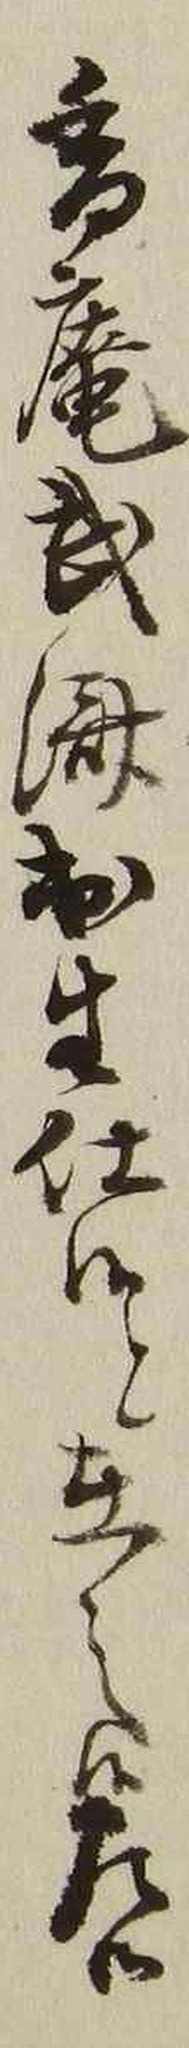香庵武済出生仕候と在之候左候
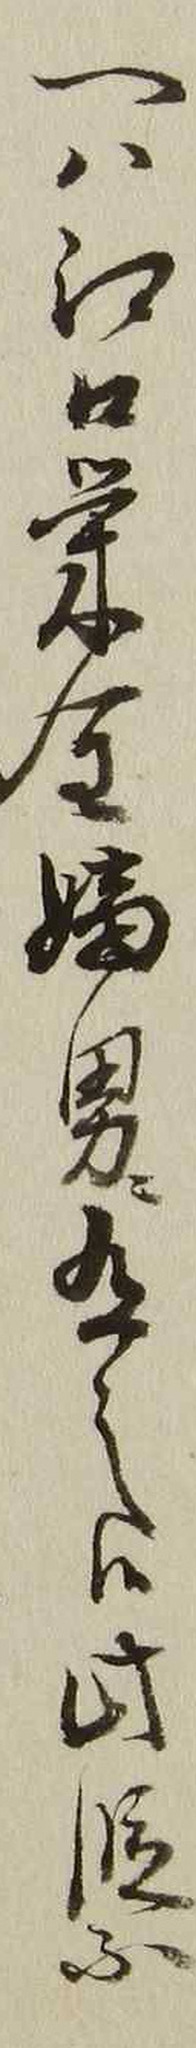へハ江口栄全嫡男ニ有之候此段不
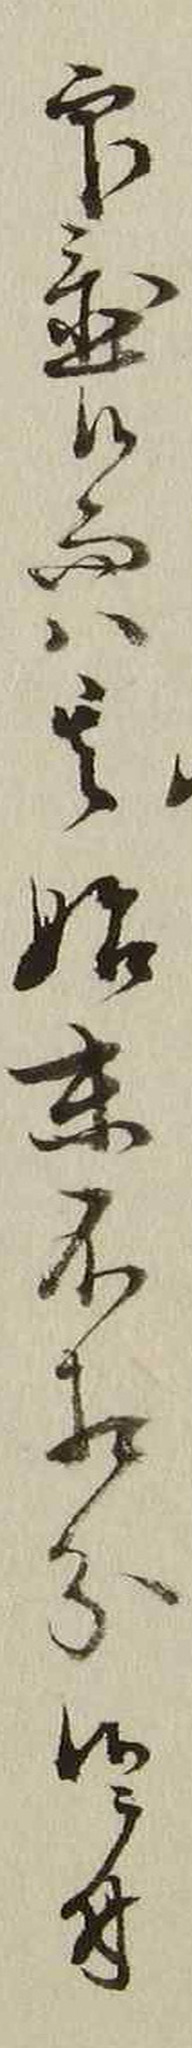印置候而ハ其始末不相分候ニ付
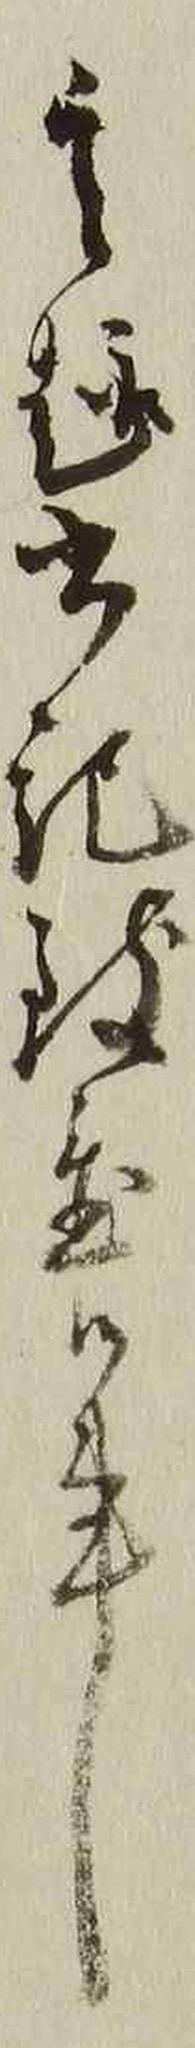其趣書記致置事候事
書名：諸士系譜　巻之36　は之部4
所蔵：会津若松市立会津図書館
